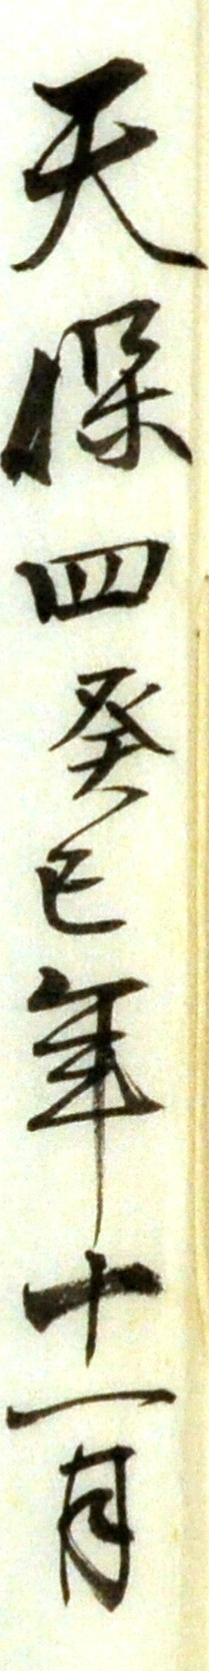天保四癸巳年十一月
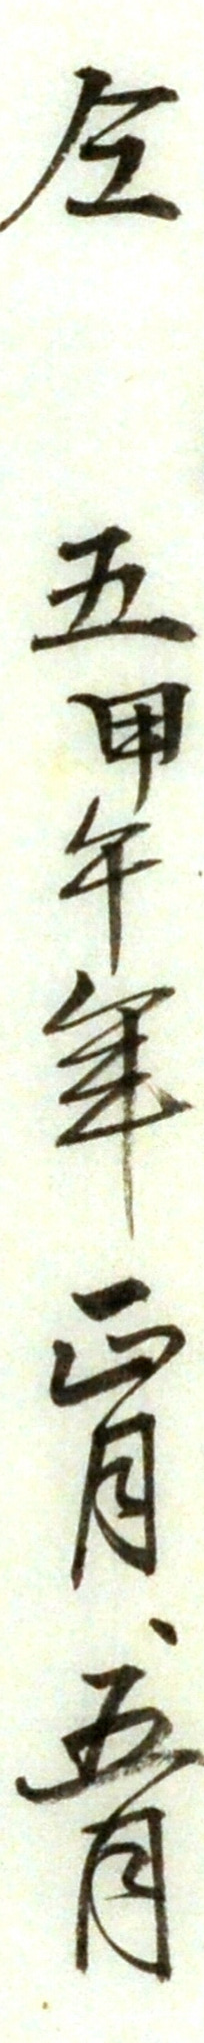同五甲午年正月、五月
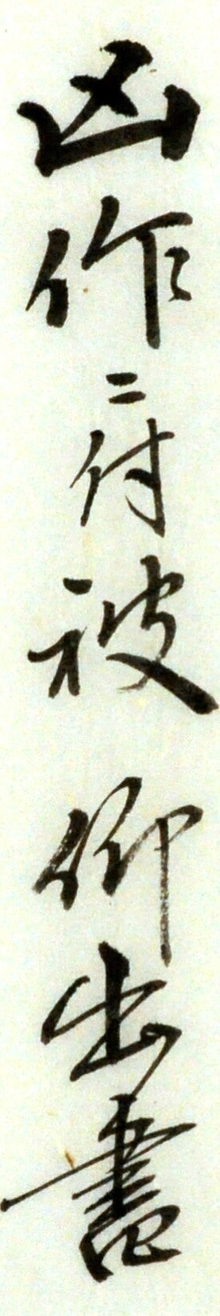凶作ニ付被仰出書

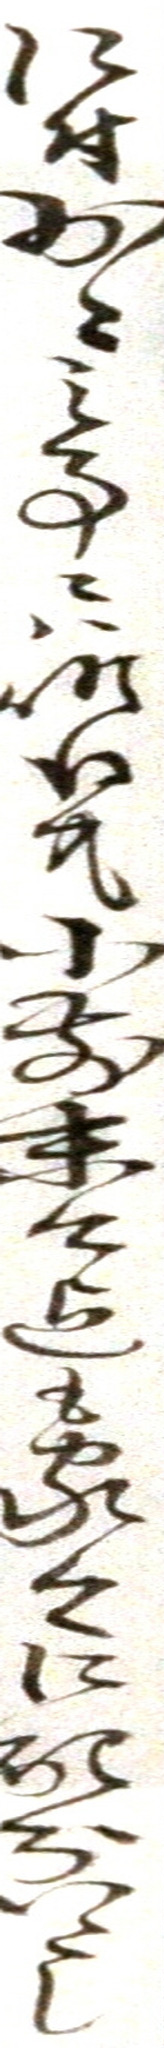に付少々之事ニハ候得共小前末々迄も家々に配分いたし
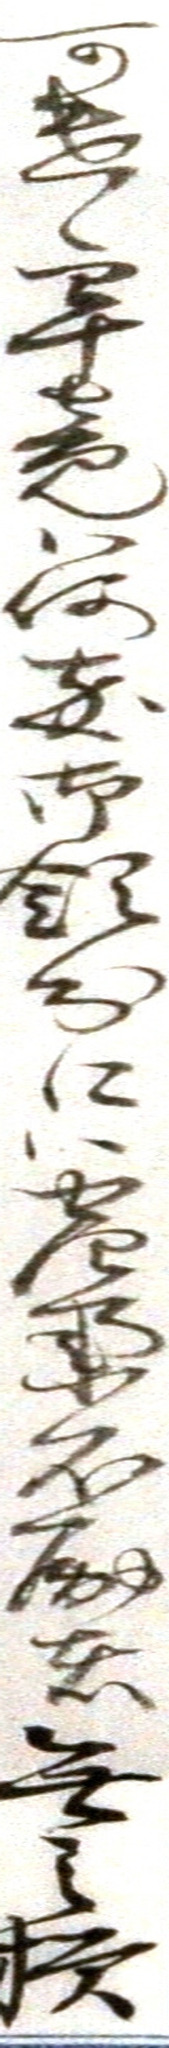可遣候畢竟ハ何卒御領分にハ農事不励者無之様
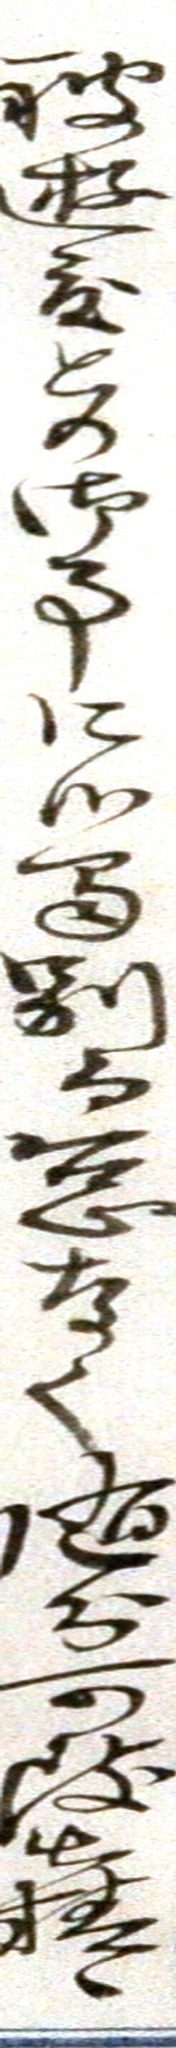被遊度との御事に候間別而怠なく随分可致出精候
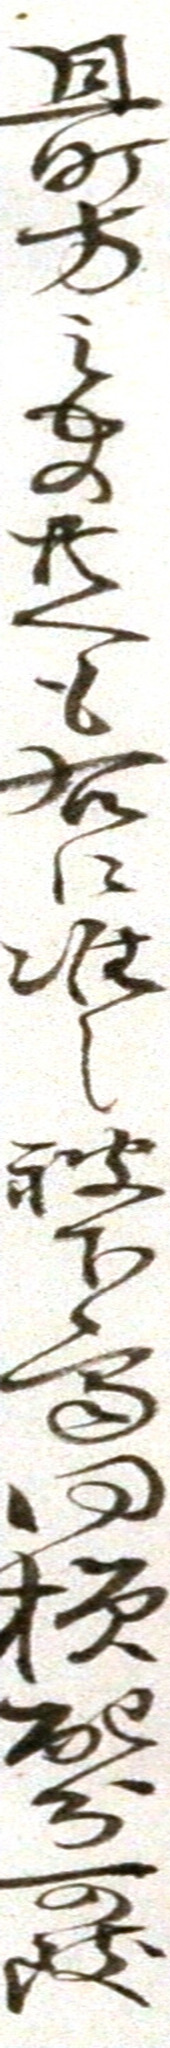且町方之もの共へも右に准し被下候間同様配分可致
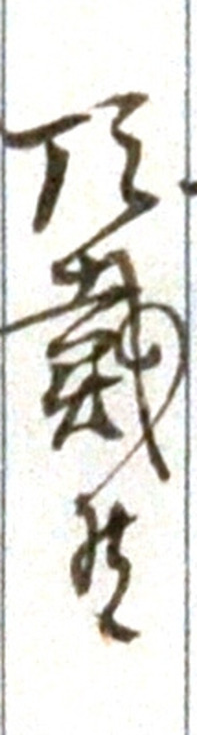頂戴候
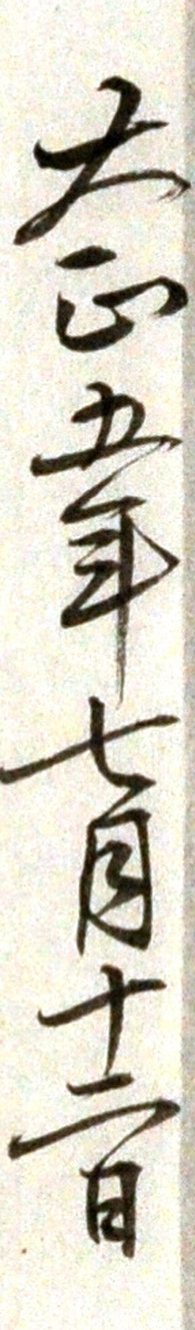大正五年七月十二日
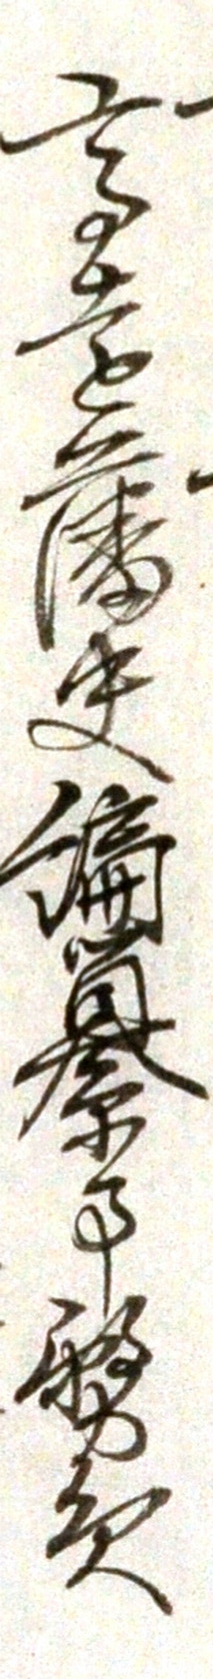高遠藩史編纂事務員
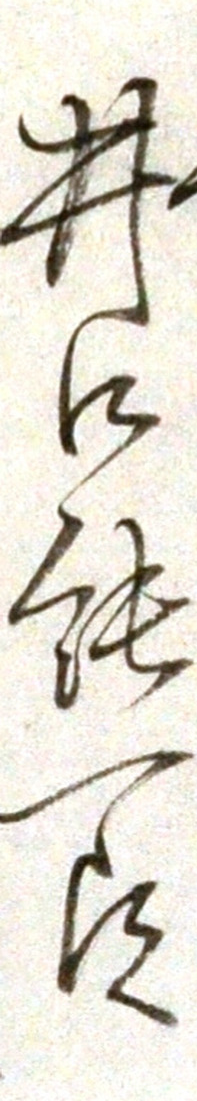井口純一郎
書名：凶作ニ付被仰出書（四通）
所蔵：伊那市立高遠町図書館・合同会社AMANE
